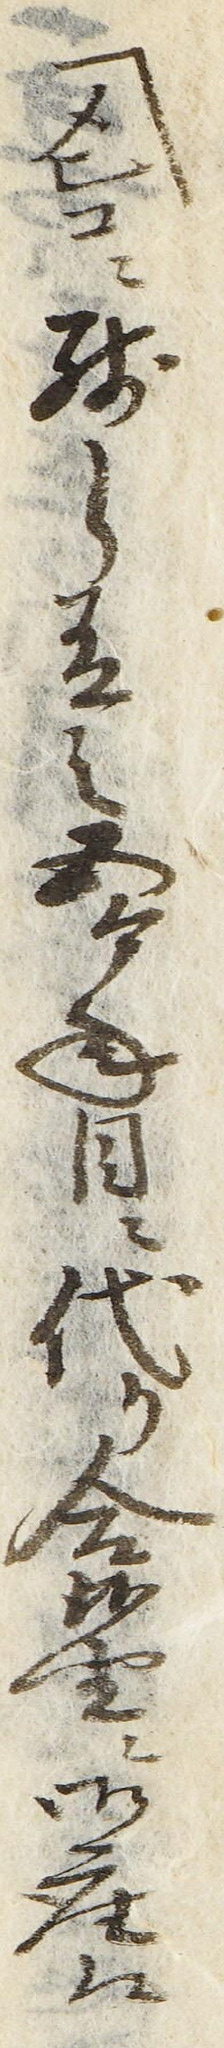「メヒコニ残し有之五ケ年目ニ代り合候由ニ御座候

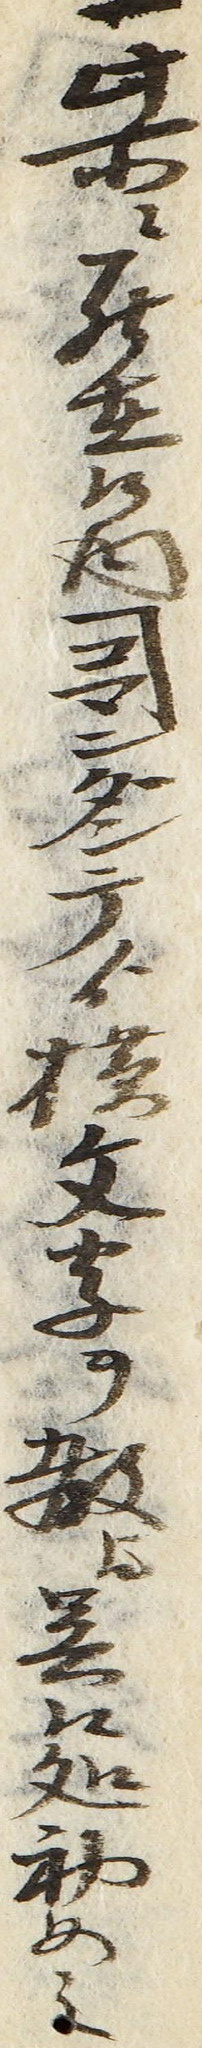一此所ニ罷在候内「コマンダンテゟ横文字ヲ教江呉候処初め之
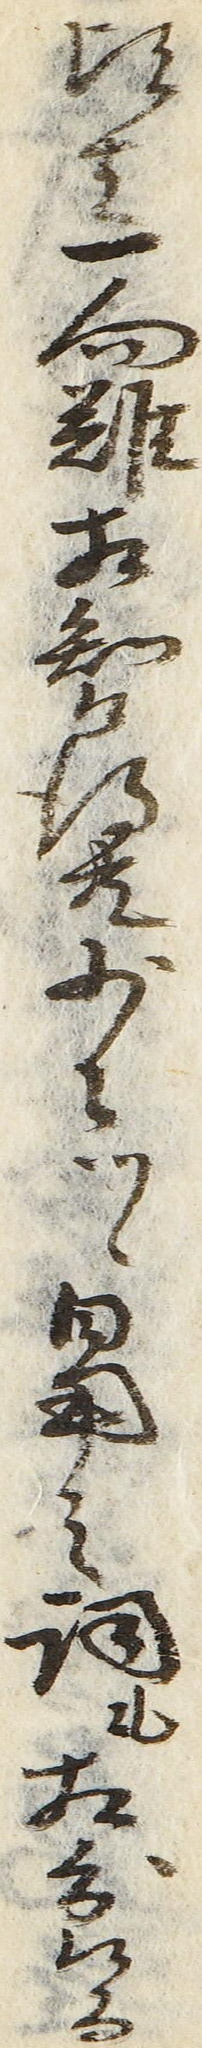頃者一向難相知候得共少々ツヽ日用之詞も相分候而
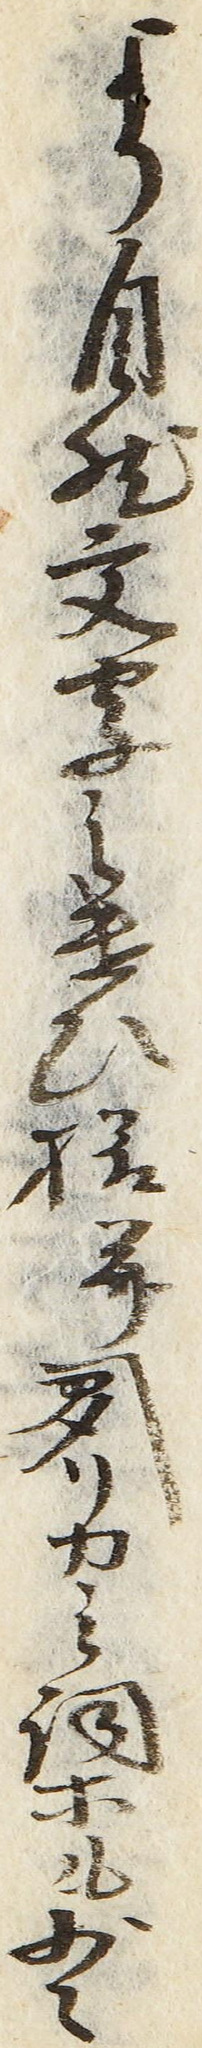より自然文字之遣ひ様幷「アメリカ之詞等も少々
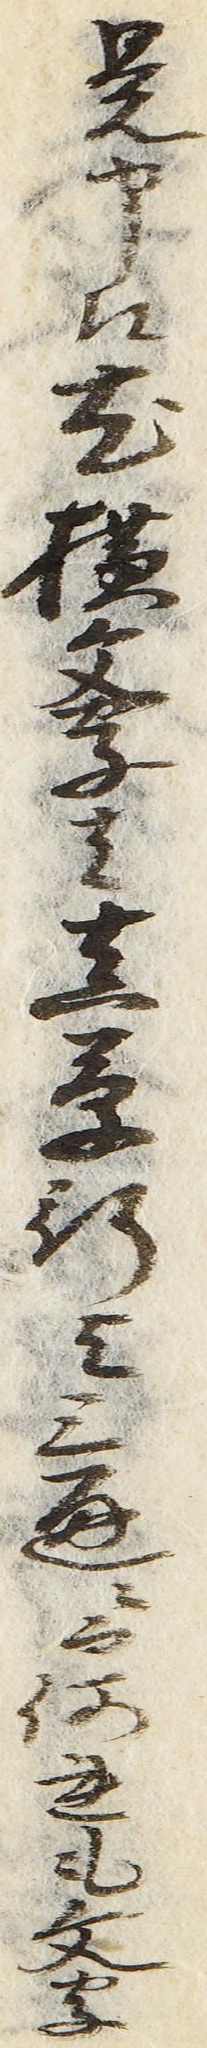覚申候尤横文字者真草行と三通ニ而何れも文字
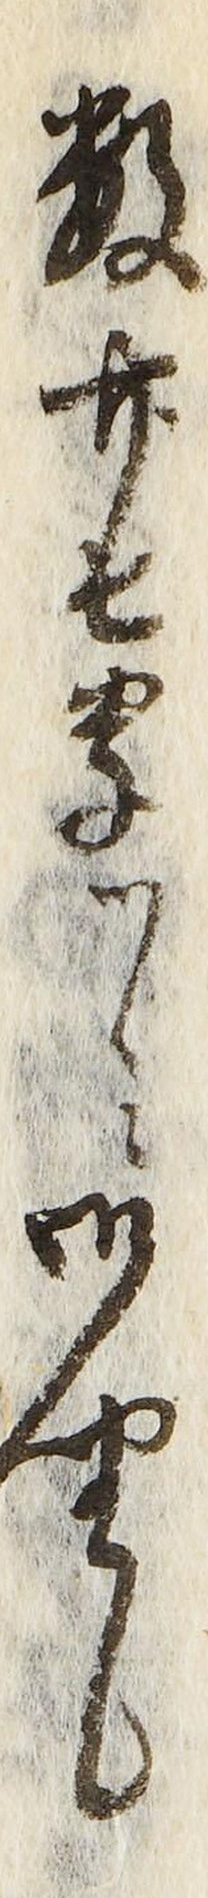数廿七字ツヽニ御座候
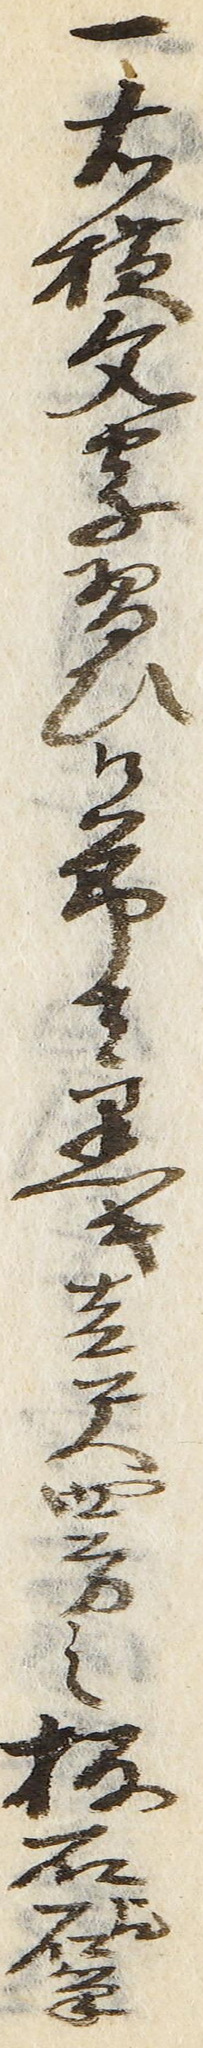一右横文字習ひ候節者黒キ壱尺四方之板石江石筆
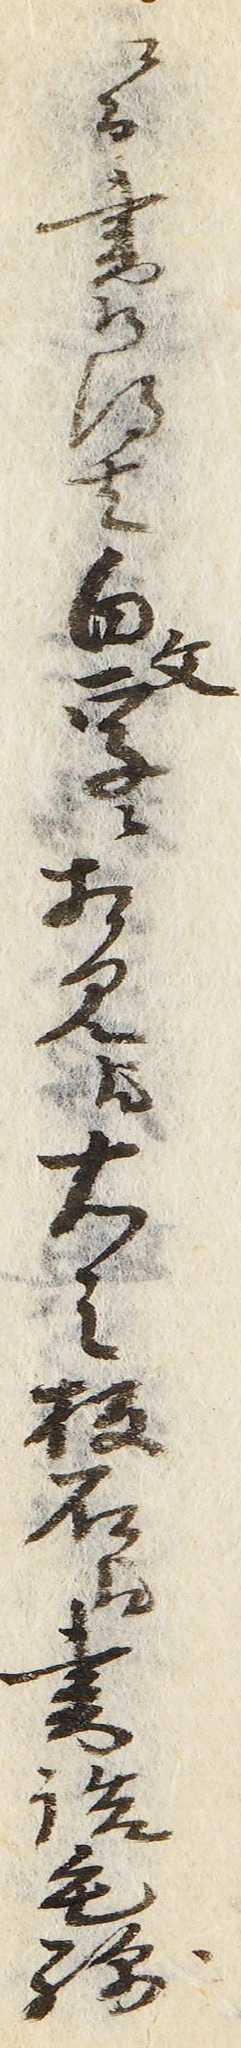ニ而書候得者白文字ニ相見江右之板石江書詰毛綿
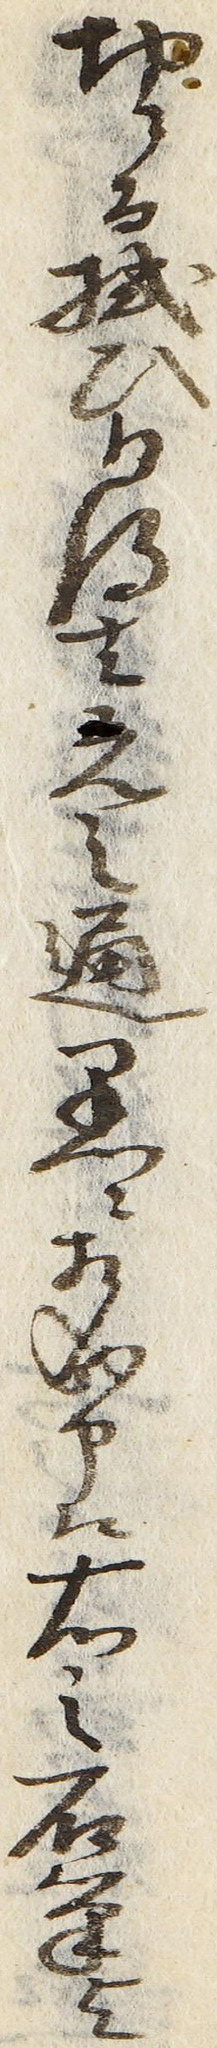切ニ而拭ひ候得者元之通黒ニ相成申候右之石筆と
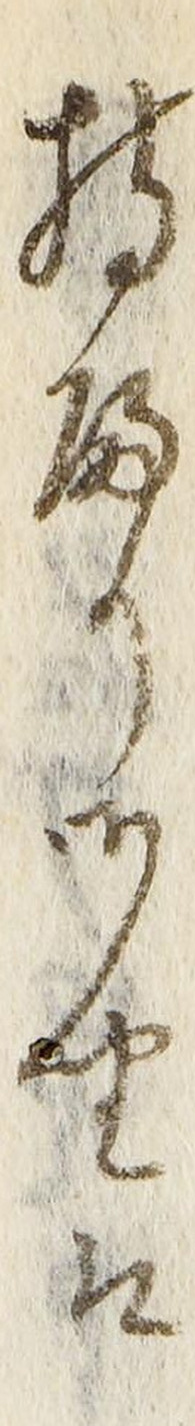持帰り御座候
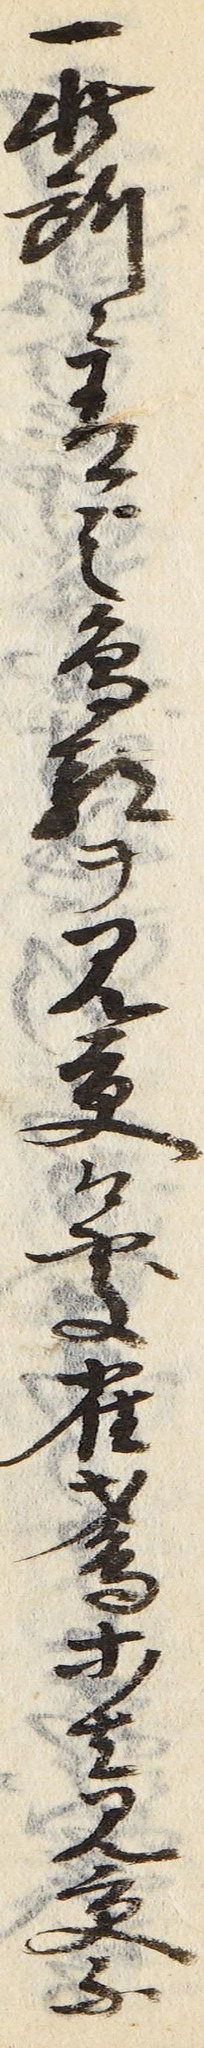一此所ニ有之鳥類ヲ見受候處雀鳶等者見受不
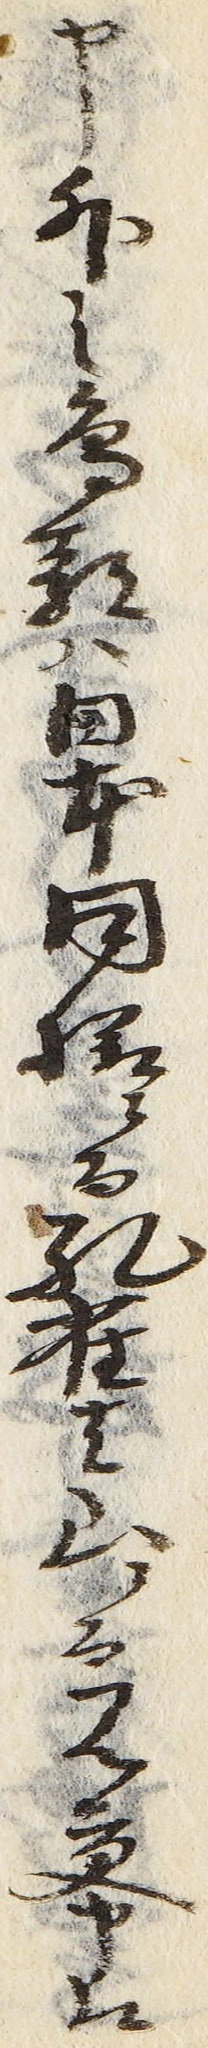申外之鳥類ハ日本同様ニ而孔雀者山ニ而見受申候
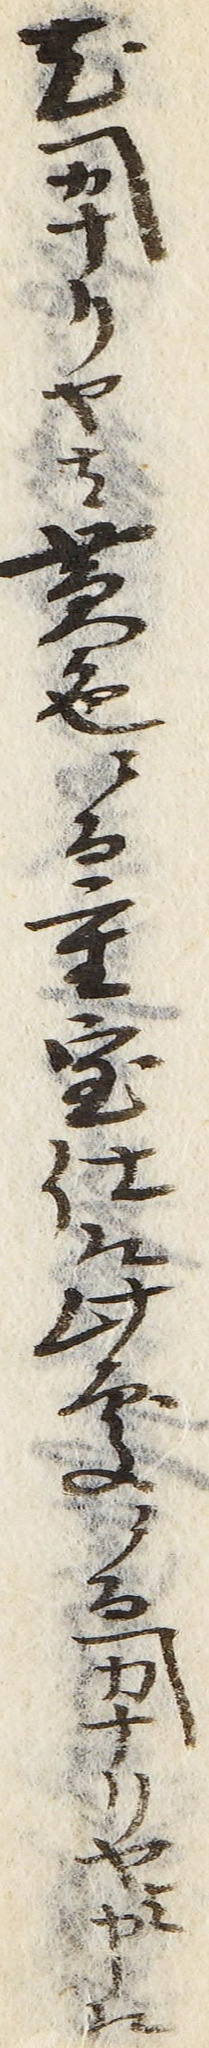尤「カナリヤ者黄色ニ而重宝仕候此處ニ而「カナリヤと申候
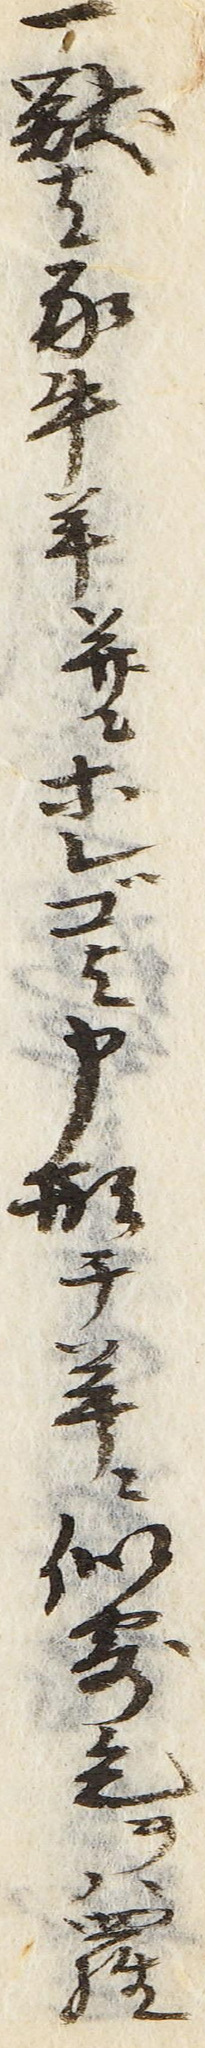一獣者豕牛羊并ニホレゴと申形チ羊ニ似寄毛ヲハ羅
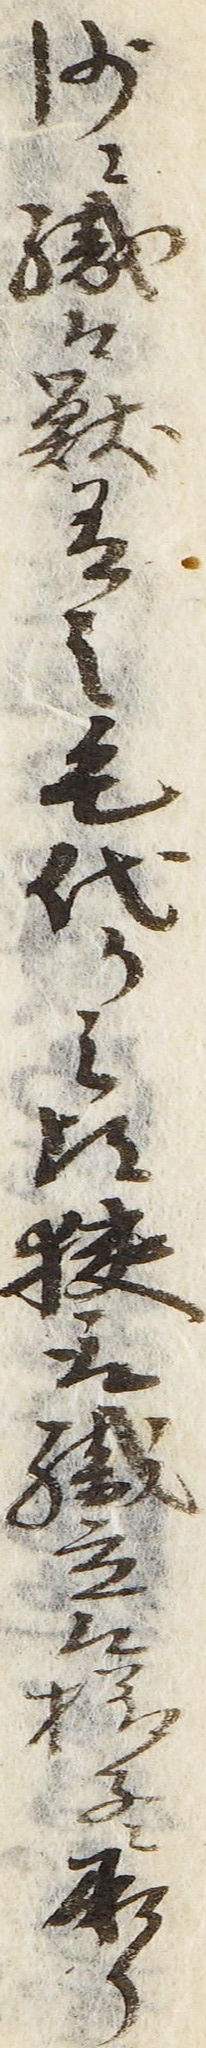沙ニ織候獣有之毛代り之頃挟取織立候様子ニ承り
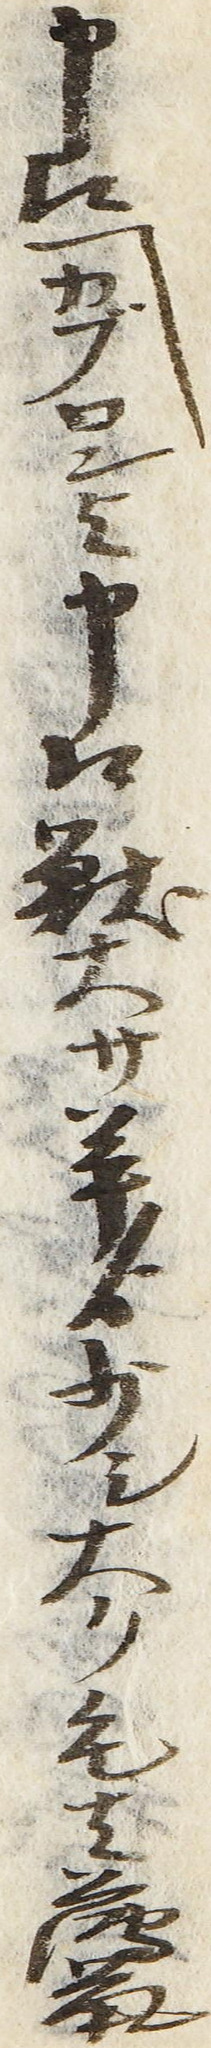申候「カブロンと申候獣大サ羊ゟ少シ大ク毛者薄鼠
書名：漂流人善助聞書
